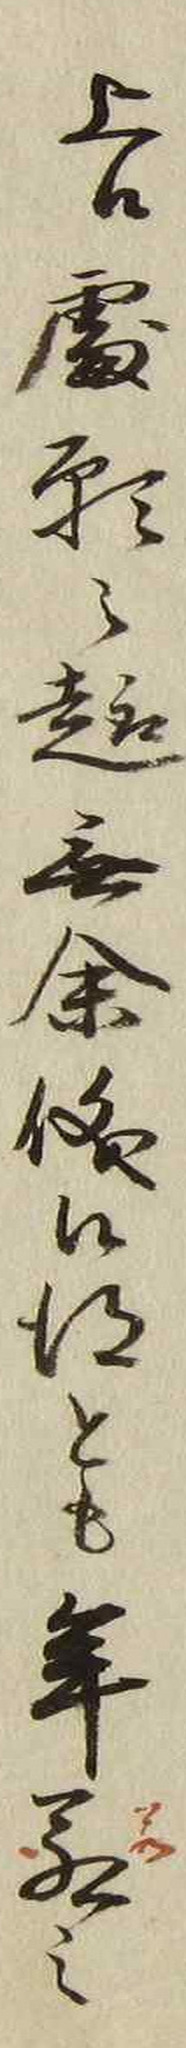上候処願之趣無余儀候得とも年若之
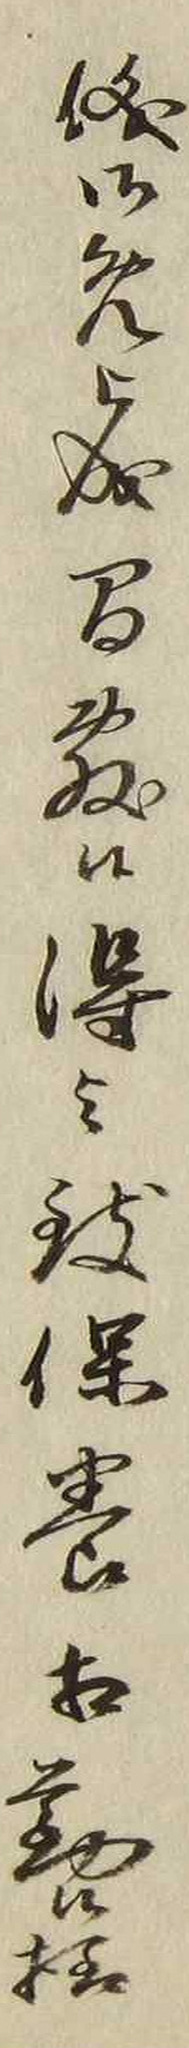儀御免被成間敷候得は致保養相勤候様

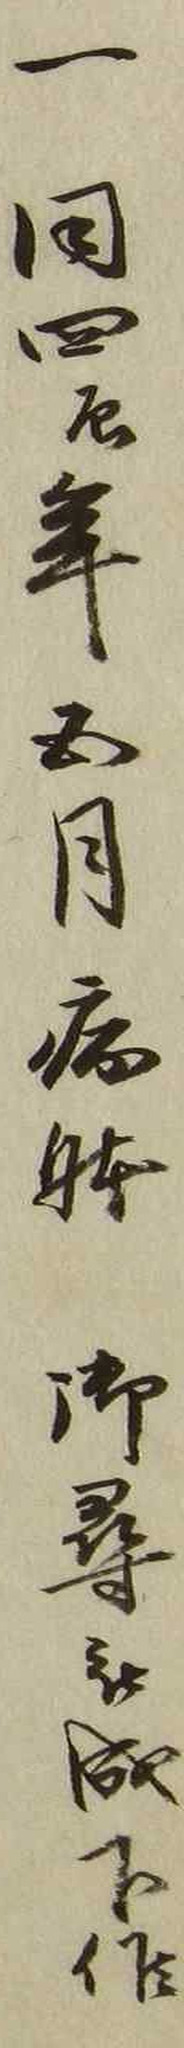一同四辰年五月病体御尋被成下候
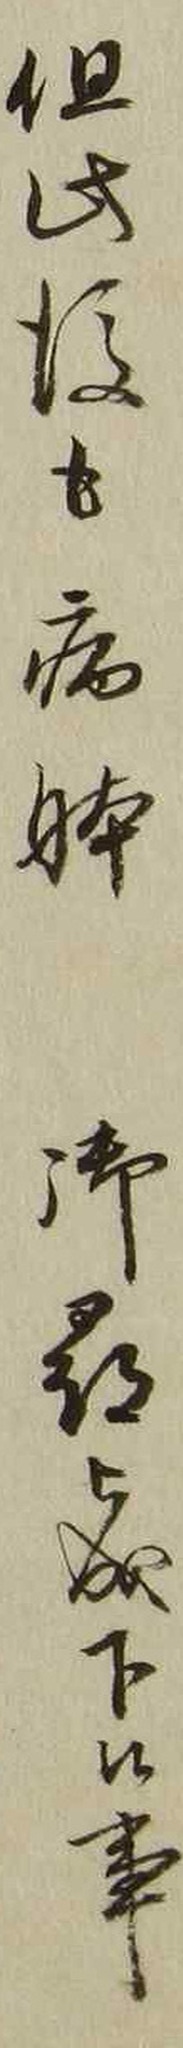但此後も病体御尋被成下候事
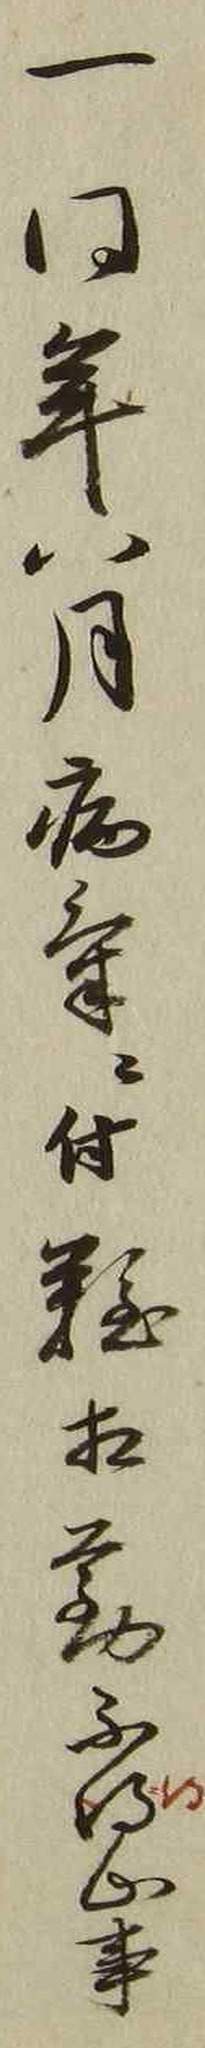一同年八月病気に付難相勤不得止事
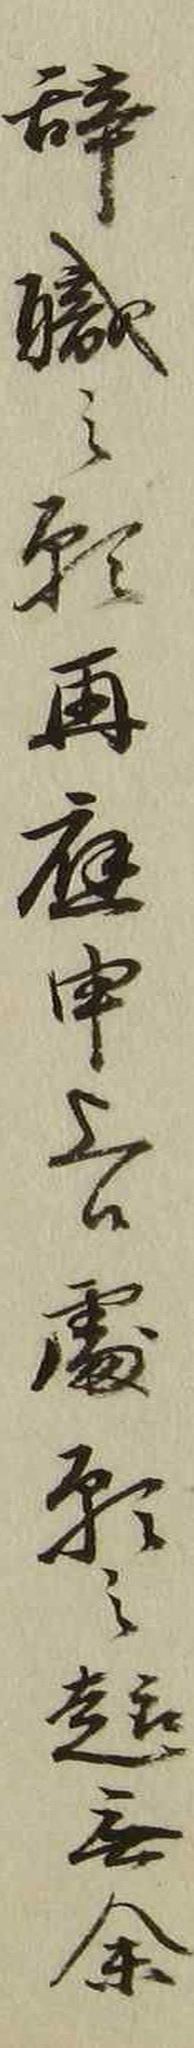辞職之願再応申上候処願之趣無余
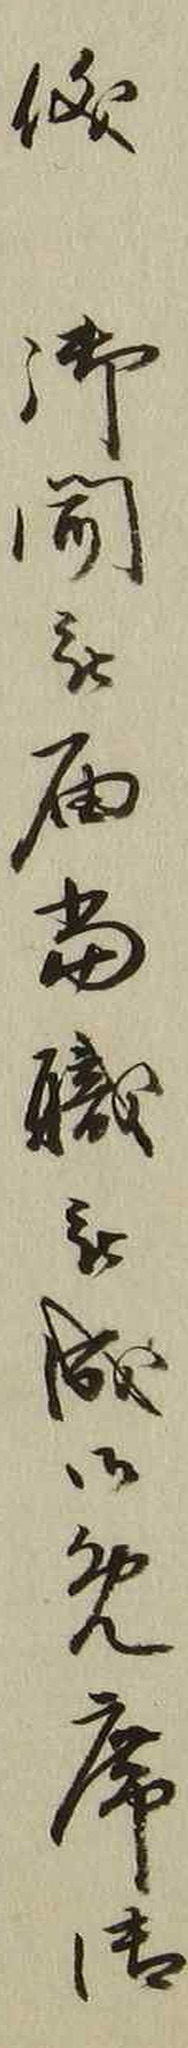儀御聞被届当職被成御免席御
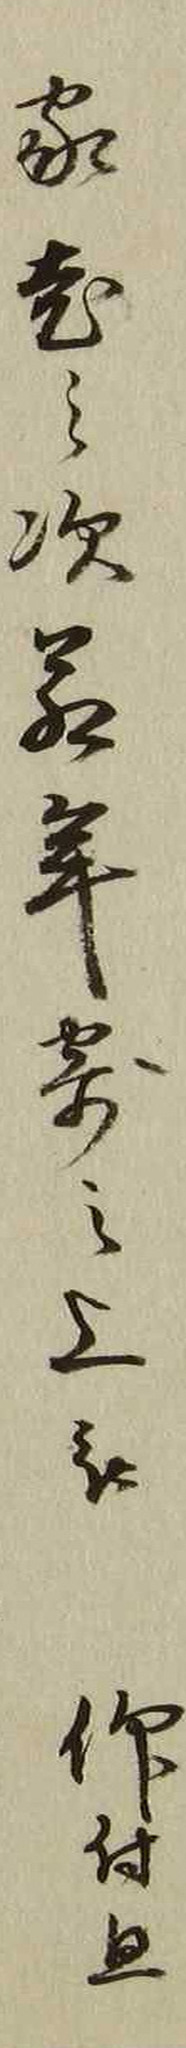家老之次若年寄之上被仰付且
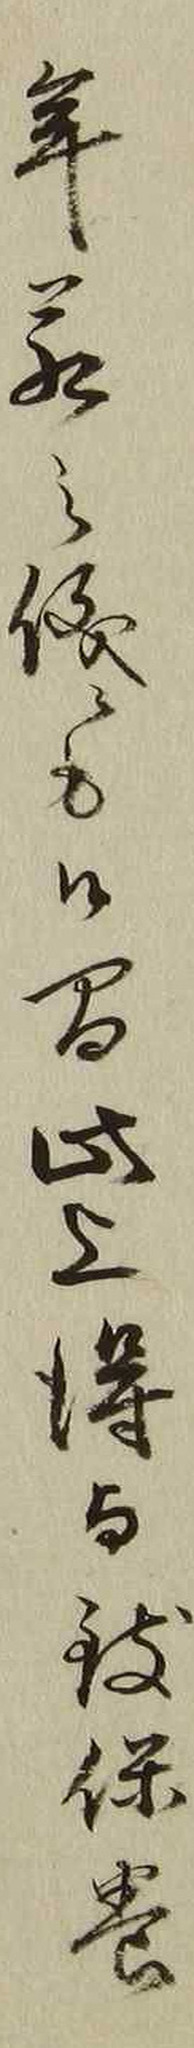年若之儀にも候間此上得と致保養
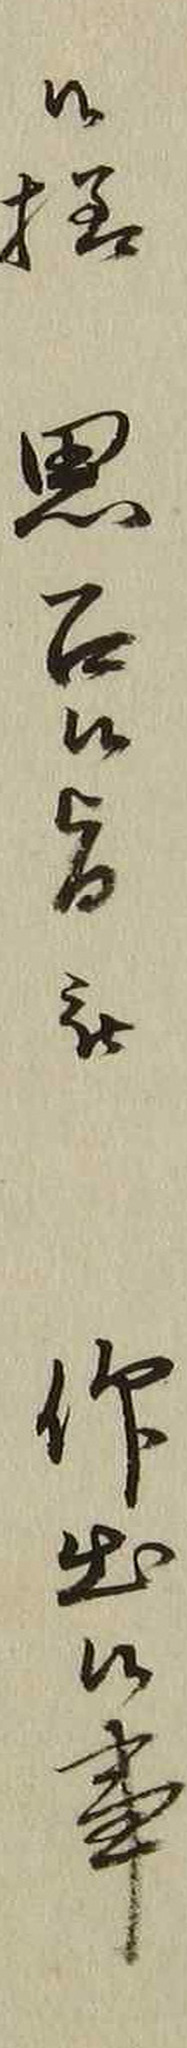候様思召候旨被仰出候事
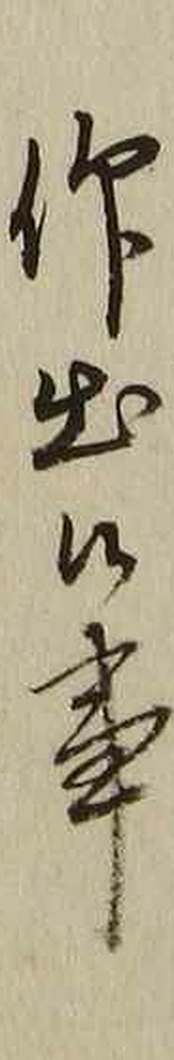仰出候事
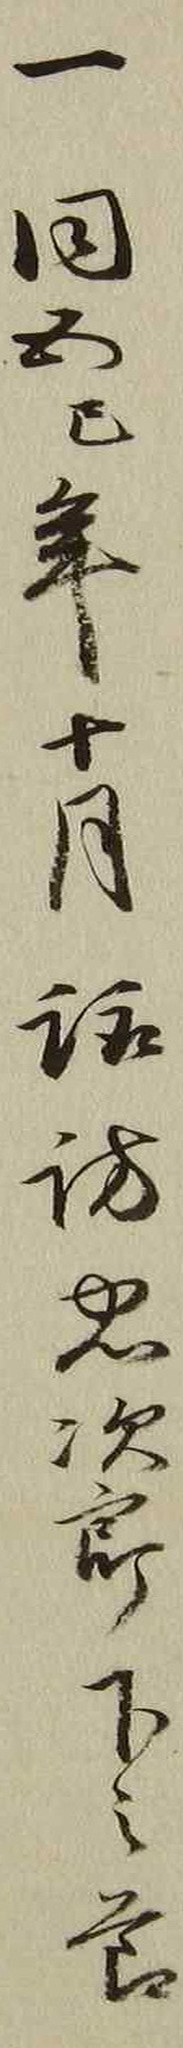一同五巳年十月諏訪忠次郎下之節
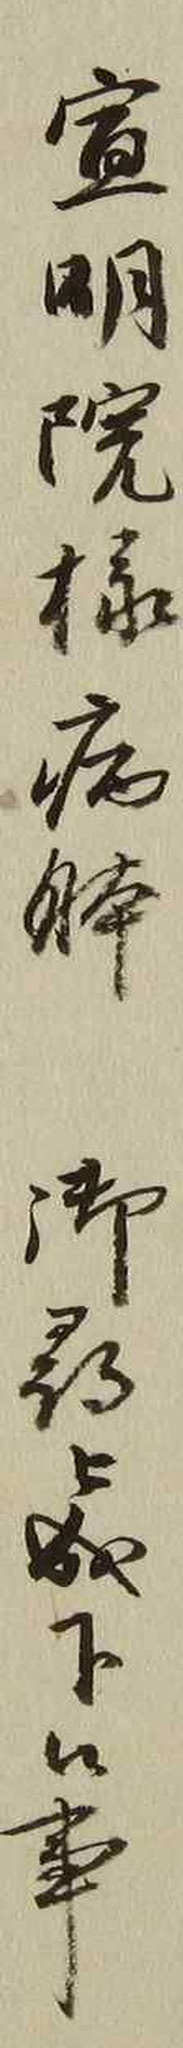宣明院様病体御尋被成下候事
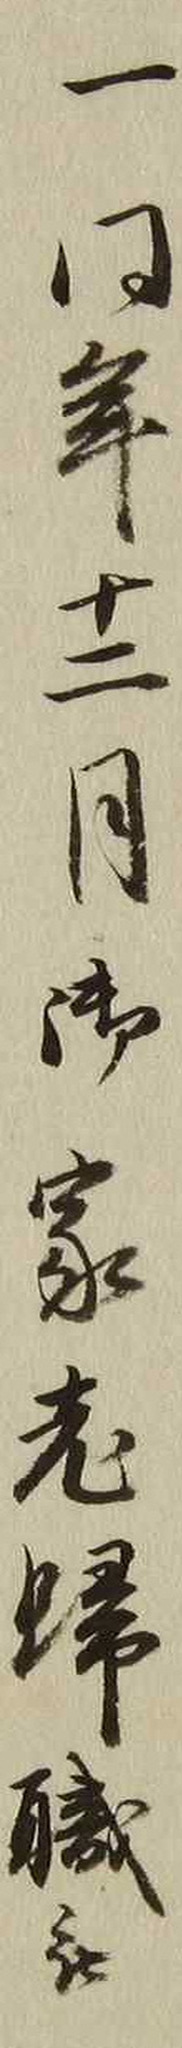一同年十二月御家老帰職被
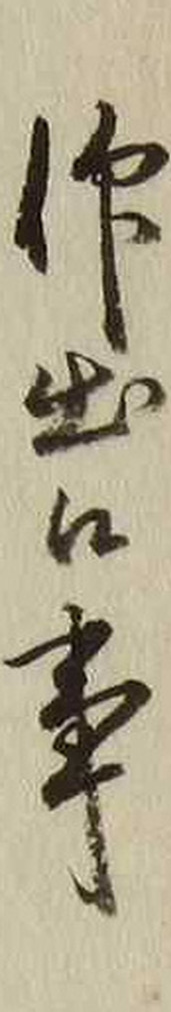仰出候事
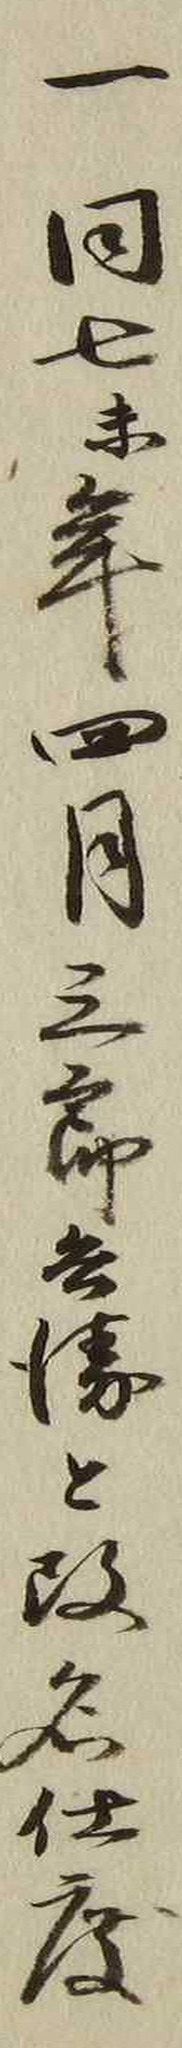一同七未年四月三郎兵衛と改名仕度
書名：諸士系譜　巻之125　た之部1
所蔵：会津若松市立会津図書館
